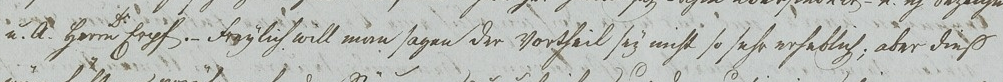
u. A. Herrn DrErpf. – Freylich will man sagen der Vortheil sey nicht so sehr erheblich; aber dieß
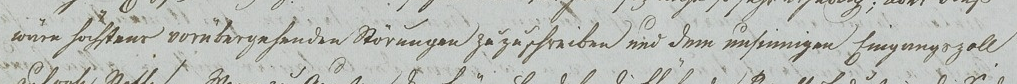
wäre höchstens vorübergehenden Störungen zuzuschreiben und dem unsinnigen Eingangszoll
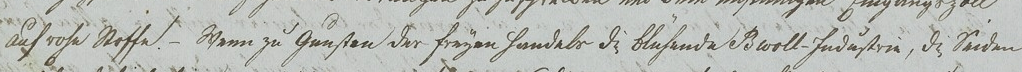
auf rohe Stoffe. – Wenn zu Gunsten des freyen Handels die blühende Bwoll -Industrie, die Seiden
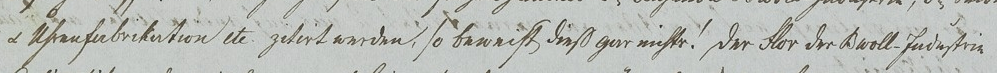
& Uhrenfabrikation etc. zitirt werden, so beweist dieß gar nichts! Der Flor der Bwoll -Industrie
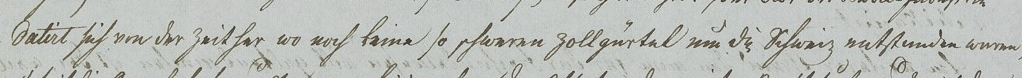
datirt sich von der Zeit her wo noch keine so schweren Zollgürtel um die Schweiz entstanden waren,
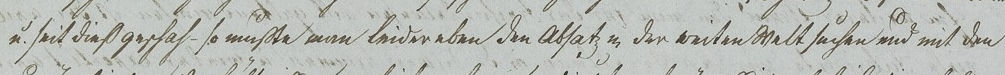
u. seit dieß geschah – so mußte man leider eben den Absatz in der weiten Welt suchen und mit den
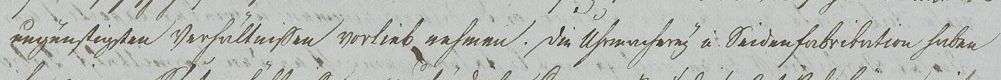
ungünstigsten Verhältnissen vorlieb nehmen. Die Uhrmacherey u. Seidenfabrikation haben
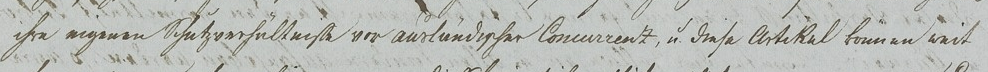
ihre eigenen Schutzverhältnisse vor ausländischer Concurrenz, u. diese Artikel können weit
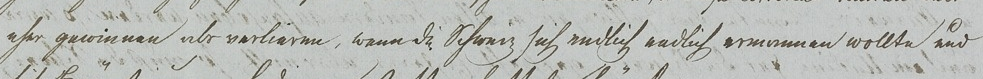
eher gewinnen als verlieren, wenn die Schweiz sich endlich endlich ermannen wollte und
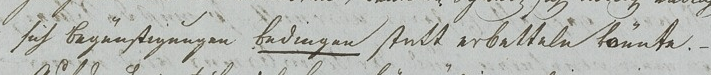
sich Begünstigungen bedingen statt erbetteln könnte. –
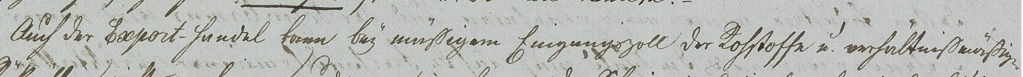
Auch der Export-Handel kann bey mäßigem Eingangszoll der Rohstoffe u. verhältnißmäßigen
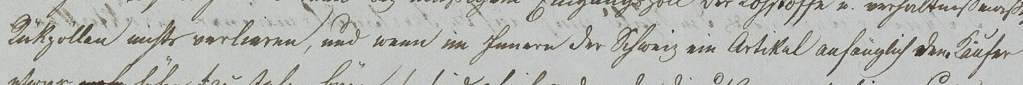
Rükzöllen nichts verlieren, und wenn im Innern der Schweiz ein Artikel anfänglich den Käufer
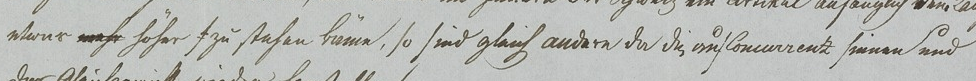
etwas mehr höher s zu stehen käme, so sind gleich andere da die auf Concurrenz sinnen und
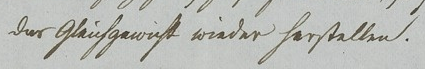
das Gleichgewicht wieder herstellen.
